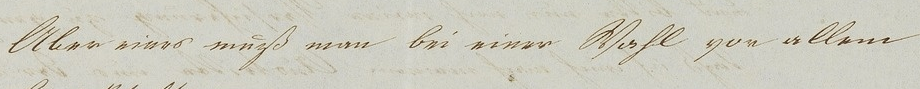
Aber eines muß man bei einer Wahl vor allem
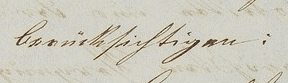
berücksichtigen:
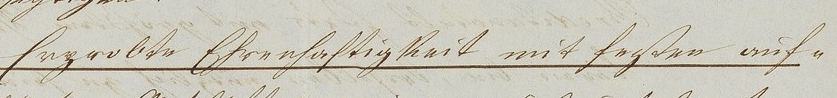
Erprobte Ehrenhaftigkeit mit festen auf-
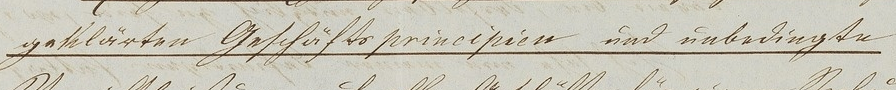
geklärten Geschäftsprincipien und unbedingte
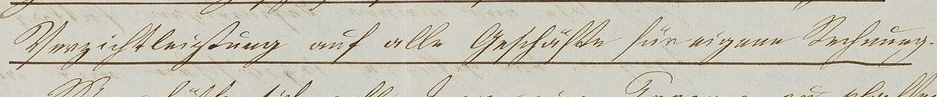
Verzichtleistung auf alle Geschäfte für eigene Rechnung.
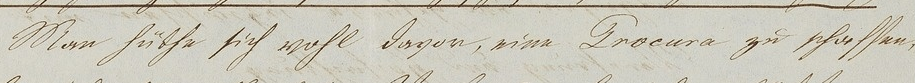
Man hüthe sich wohl davor, eine Procura zu schaffen,
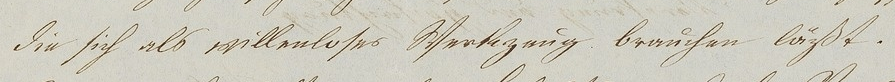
die sich als willenloses Werkzeug brauchen läßt.
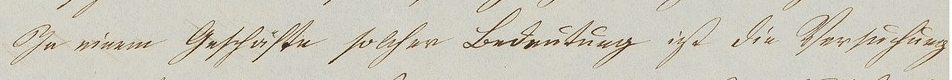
In einem Geschäfte solcher Bedeutung ist die Versuchung
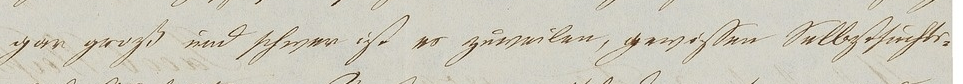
gar groß und schwer ist es zuweilen, gewissen Selbstsuchts-
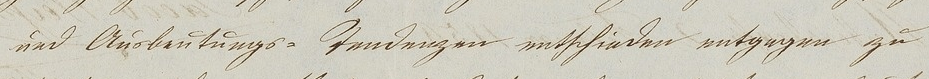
und Ausbeutungs- Tendenzen entschieden entgegen zu
